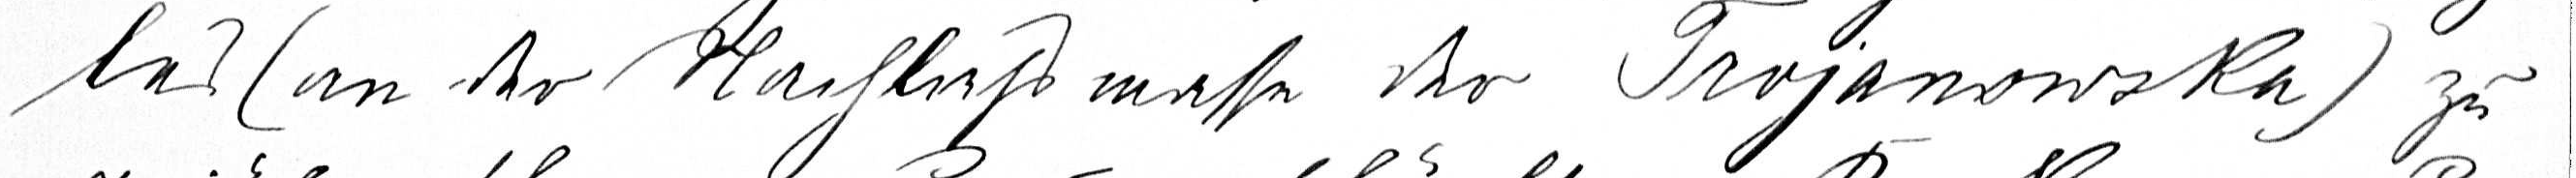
les (an der Nachlaßmasse der Trojanowska) zu
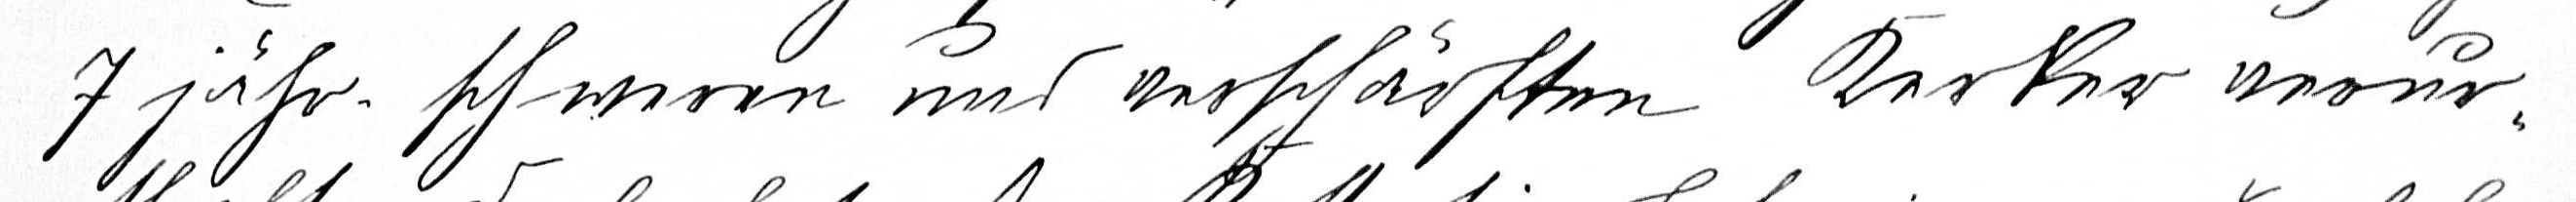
7 jähr. Schweren und verschärften Kerker verur¬
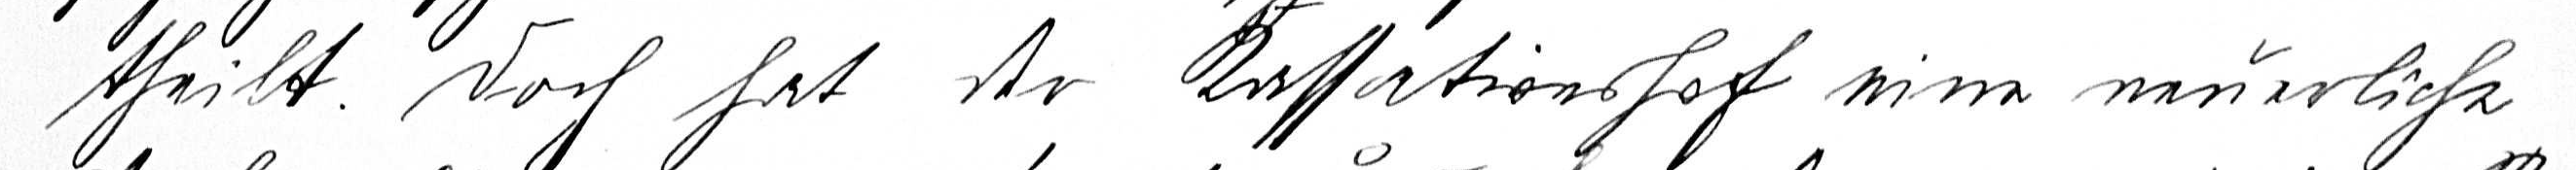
theilt. Doch hat der Kassationshof eine neuerliche
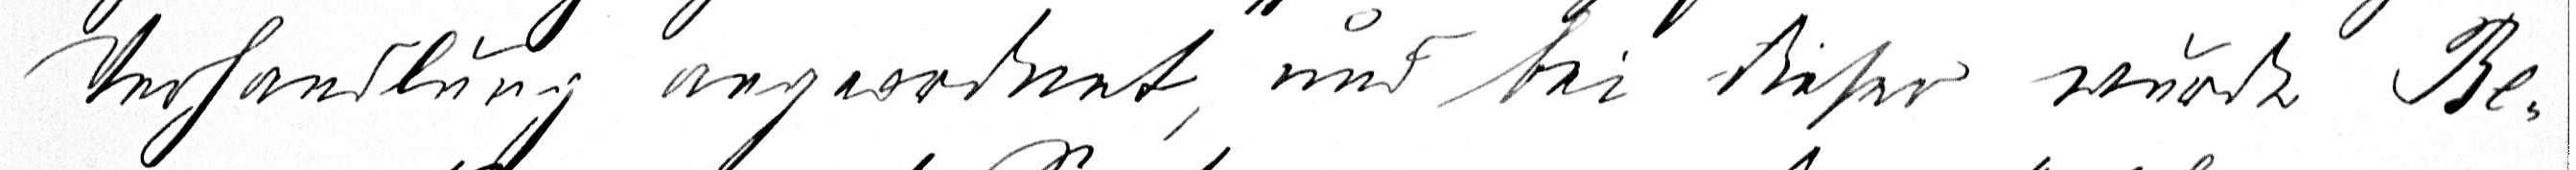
Verhandlung angeordnet, und bei dieser wurde Be¬
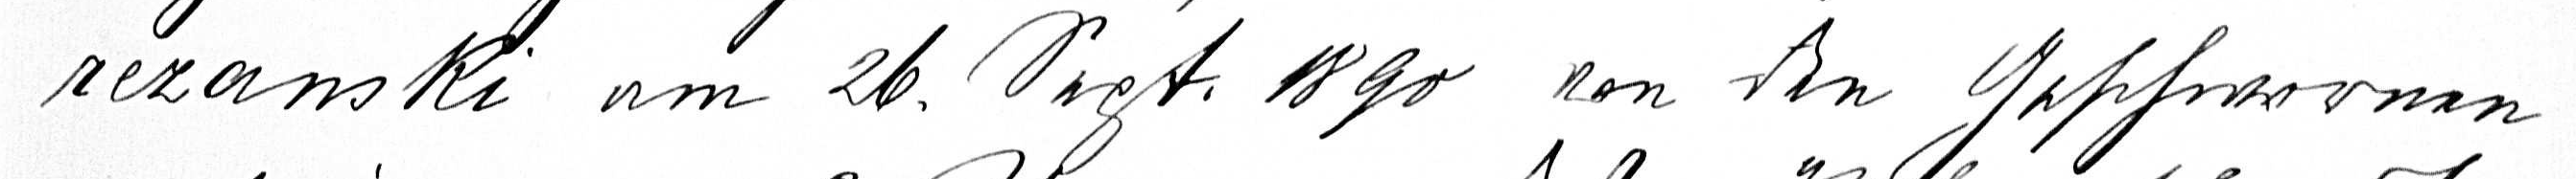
rezanski am 26. Sept. 1890 von den Geschworenen
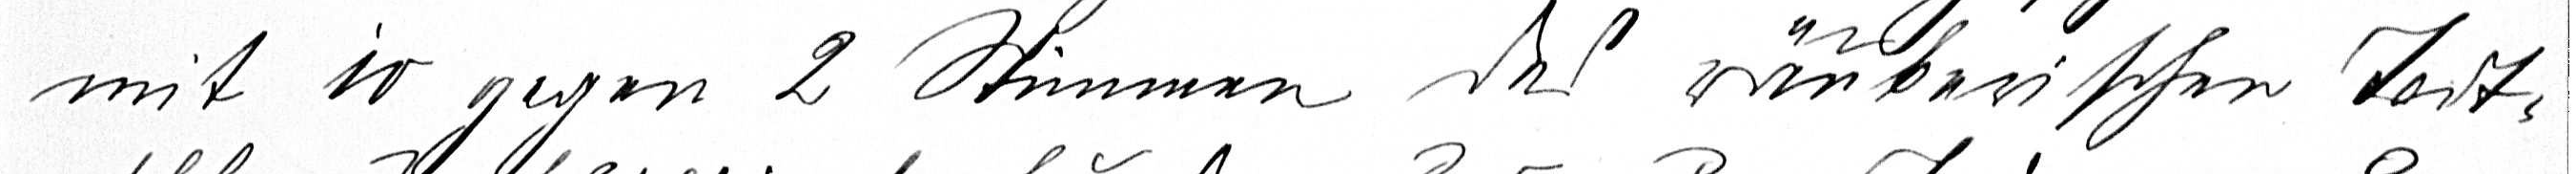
mit 10 gegen 2 Stimmen des räuberischer Todt¬
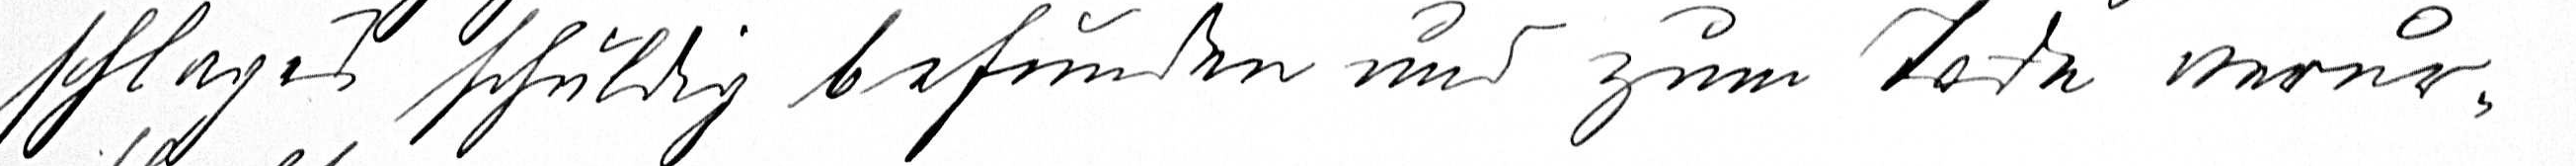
schlages schuldig befunden und zum Tode verur¬
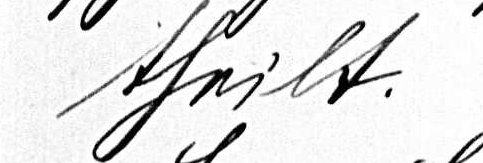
theilt.
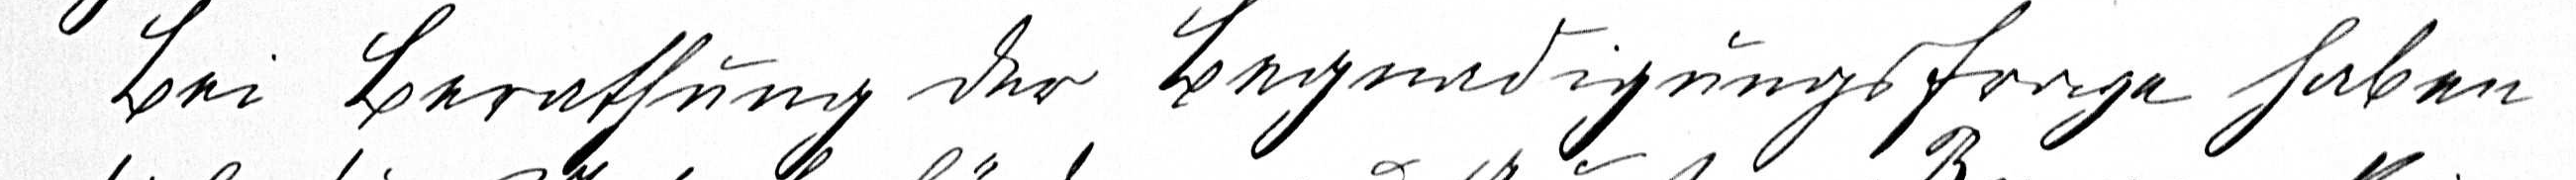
Bei Berathung der Begnadigungsfrage haben
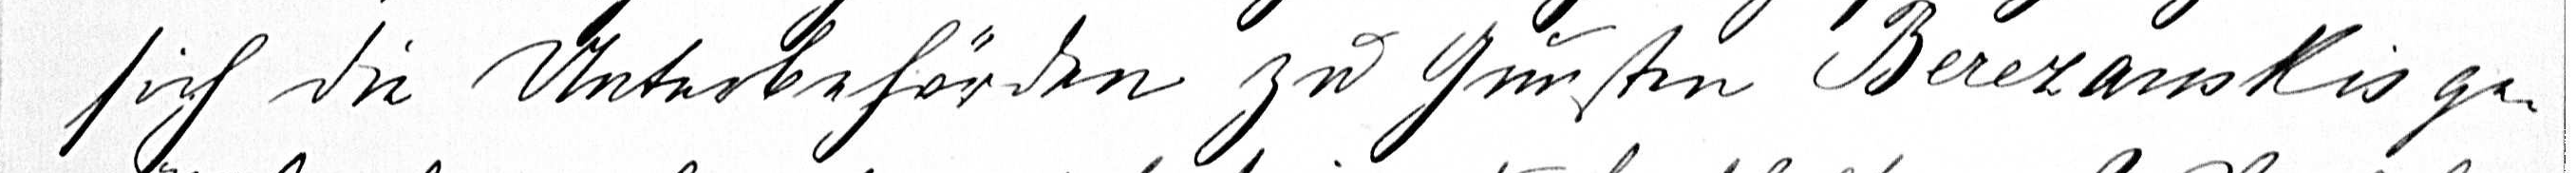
sich die Unterbehörden zu Gunsten Berezanskis ge¬
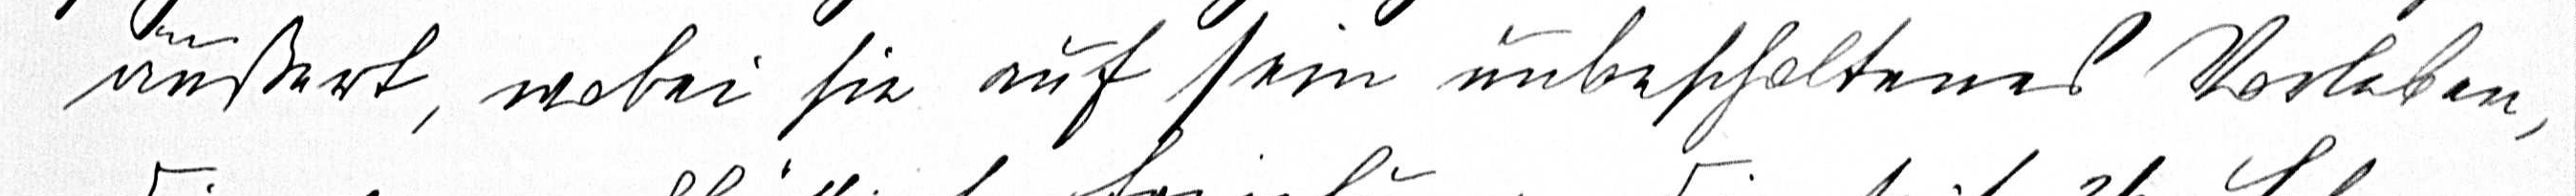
äußert, wobei sie auf sein unbescholtenes Vorleben,
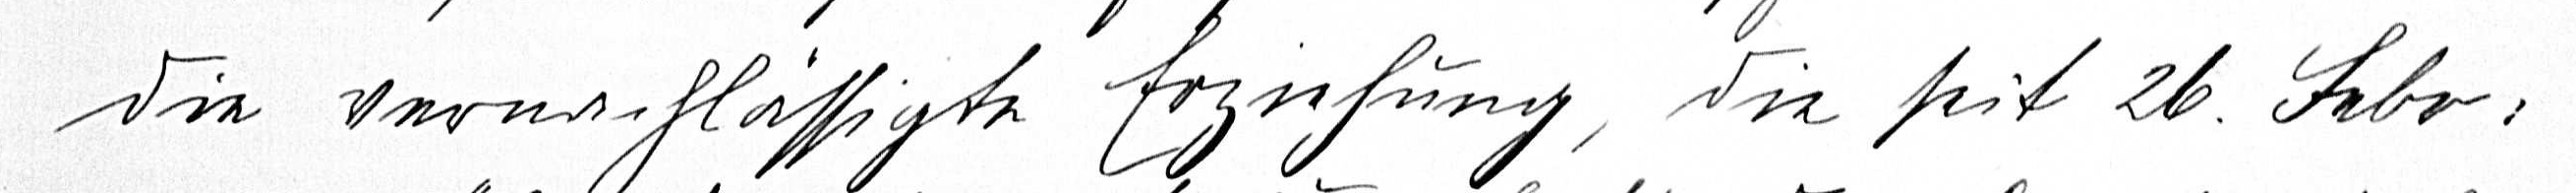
die unvernachlässigte Erziehung, die seit 26. Febr.
